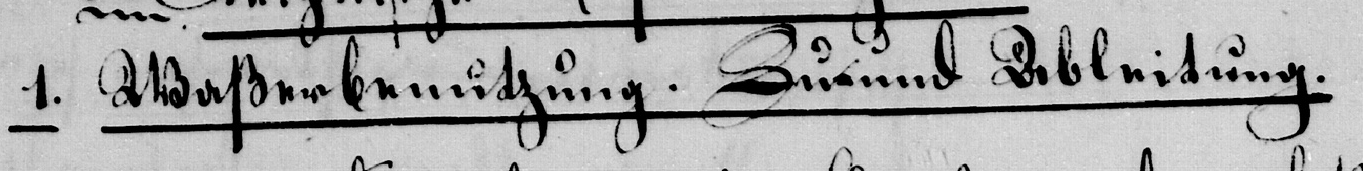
1. Waßerbenutzung. Zu- und Ableitung.
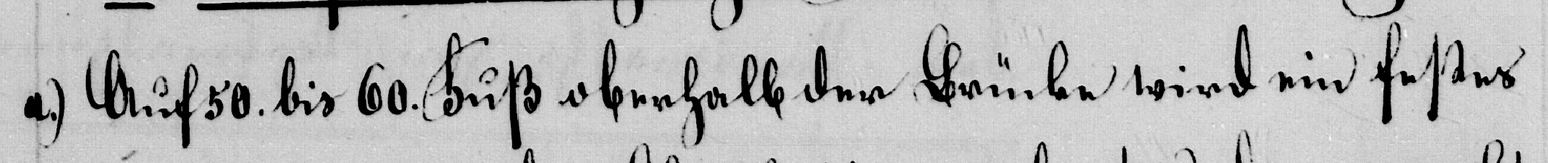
a.) Auf 50. bis 60. Fuß oberhalb der Brücke wird ein festes
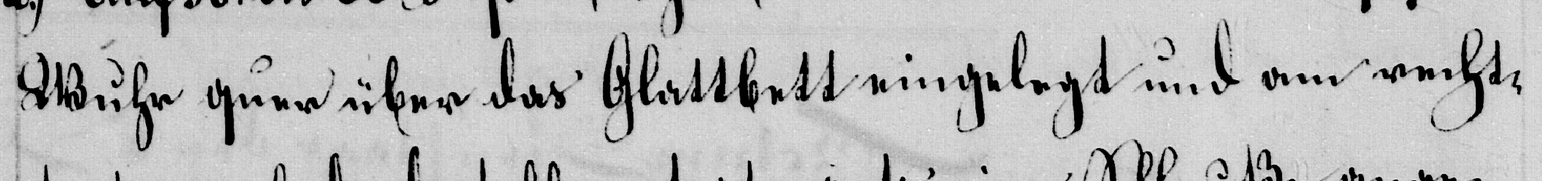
Wuhr quer über das Glattbett eingelegt und am recht¬
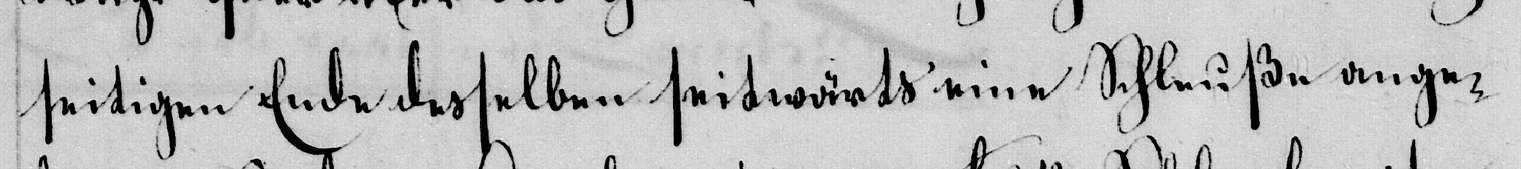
seitigen Ende desselben seitwärts eine Schleuße ange¬
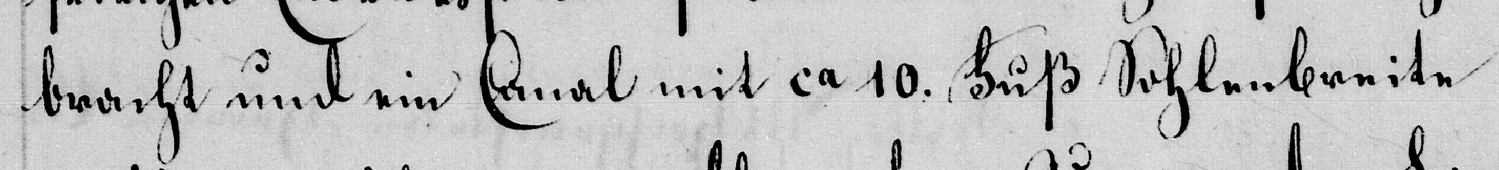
bracht und ein Canal mit ca 10. Fuß Sohlenbreite
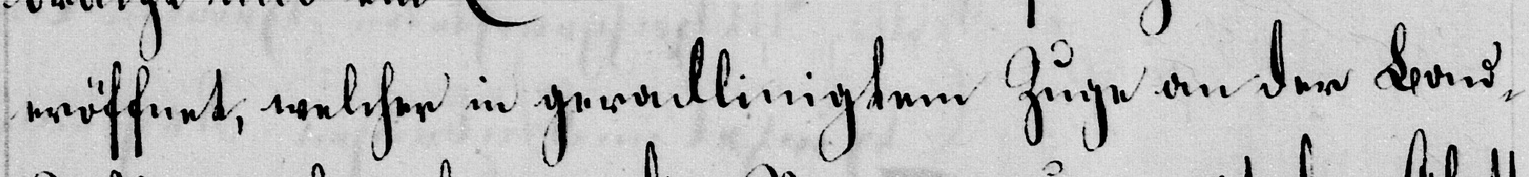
eröffnet, welcher in geradlinigtem Zuge an der Bau¬
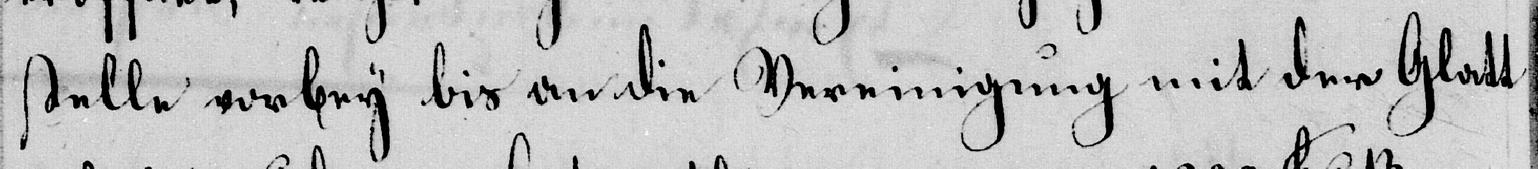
stelle vorbey bis an die Vereinigung mit der Glatt
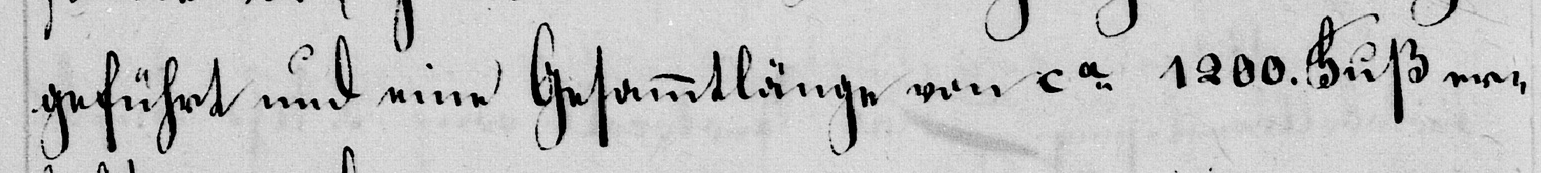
geführt und eine Gesammtlänge von ca. 1200. Fuß er¬
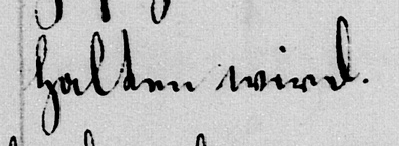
halten wird.
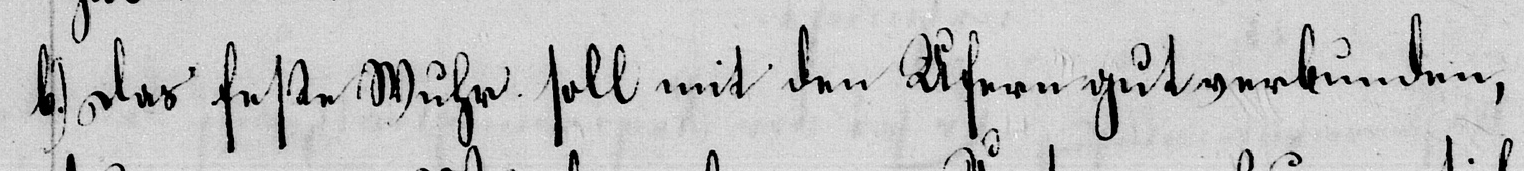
b.) Das feste Wuhr soll mit den Ufern gut verbunden,
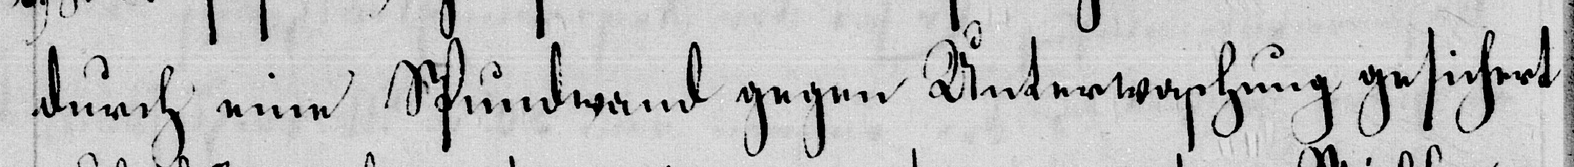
durch eine Spundwand gegen Unterwaschung gesichert
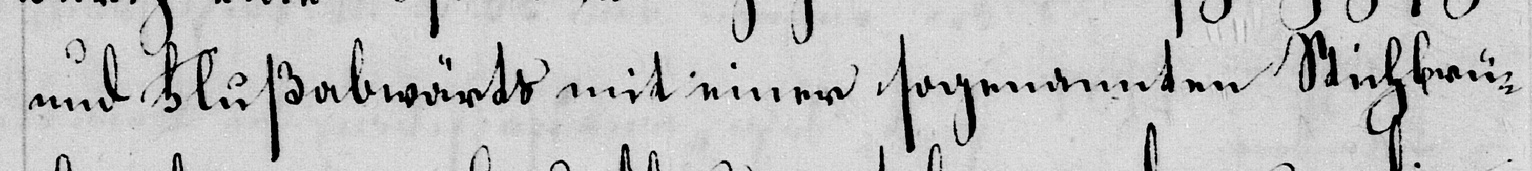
und Flußabwärts mit einer sogenannten Stichbrü¬
